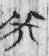癸
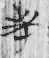未
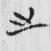之
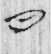日
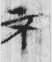不
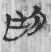○（廷）
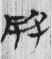○（廷）
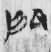門
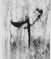又
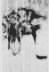敗
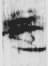正
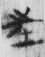往
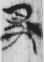○（得）
